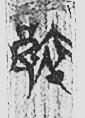被
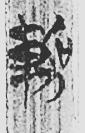{加車}
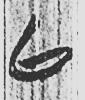㠯（以）
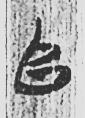𠂤
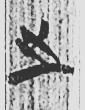之
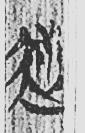述
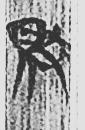敗
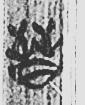晉
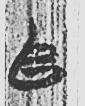𠂤
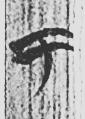于
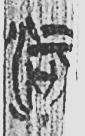河
